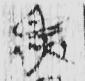○（爨）
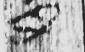月
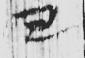己
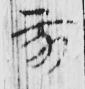亥
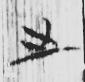之
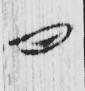日
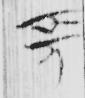長
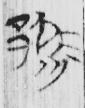○（沙）
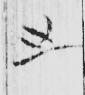之
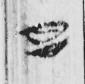旦
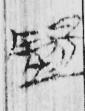○（陽）
